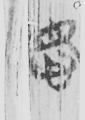悔（謀）
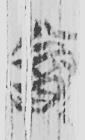猶
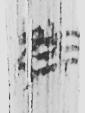隹
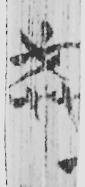戒
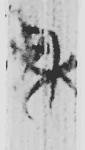和
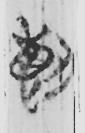{叀刀}
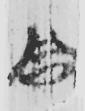同
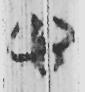心
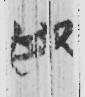母
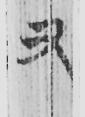又
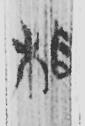相
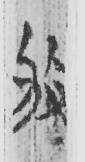{力攴}
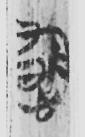恂
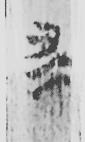求
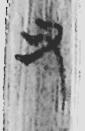又
